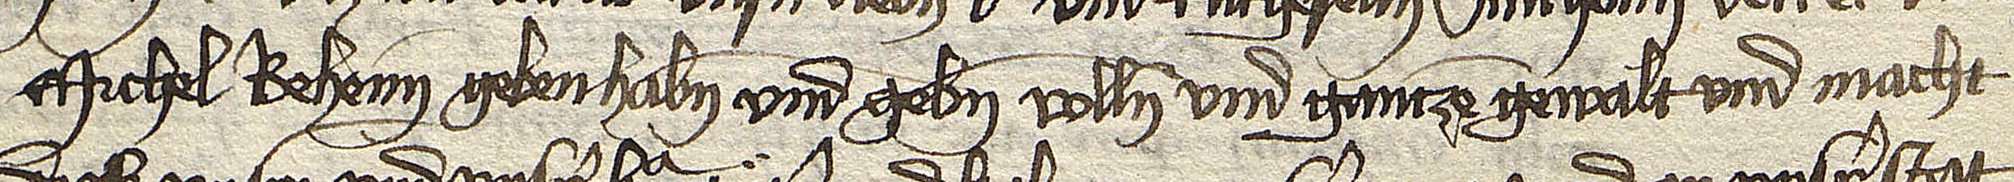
Michel Beheim geben habn* vnd gebn* volln* vnd gancʒe* gewalt vnd macht
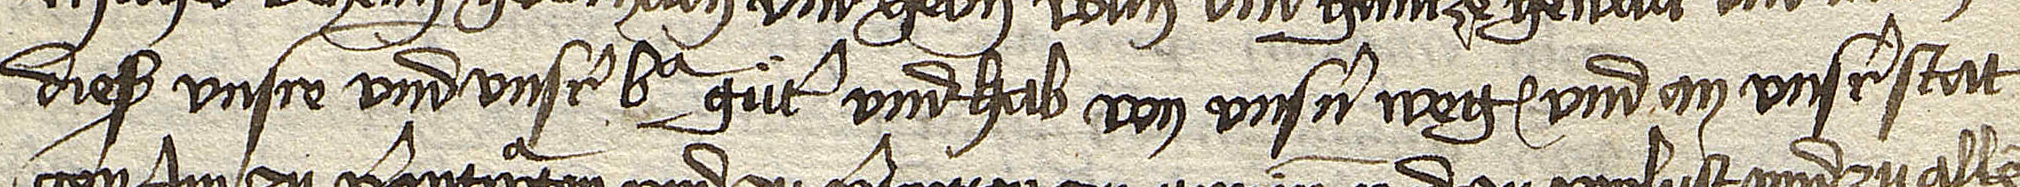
dieſ* vnſre vnd vnſr* b* güt* vnd hab von vnſn* weg* vnd an vnſr* ſtat
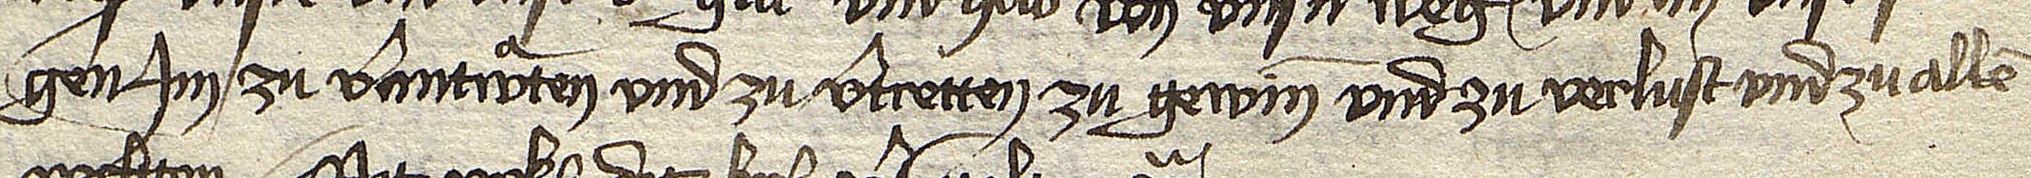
gen Im ʒu v*antw*ten vnd ʒu v*tretten ʒu gewin* vnd ʒu verluſt vnd ʒu alle*
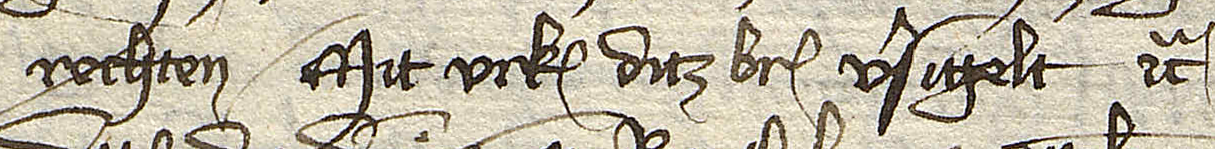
rechten / Mit vrk* dicʒ br* v*ſigelt ec*
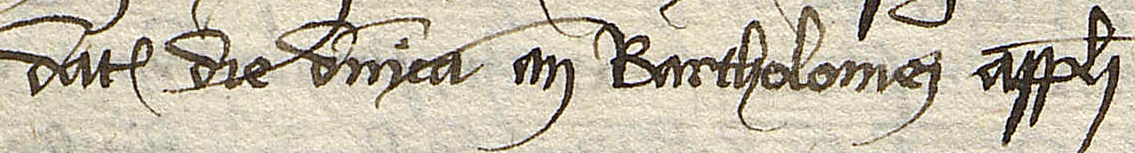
Dat* die dnica* an* Bartholomei appli*
